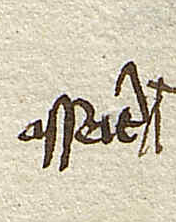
aſſeit*
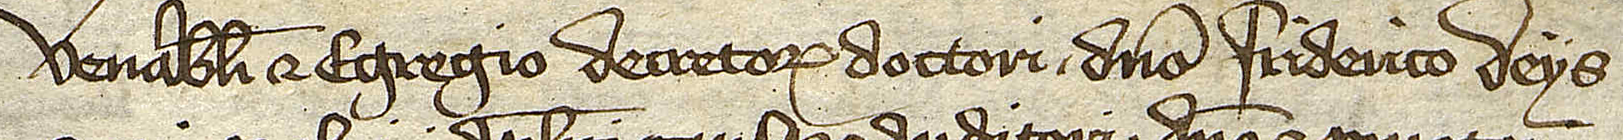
Ven*ab*li @ Egregio decretor* doctori / d*no Friderico Deys
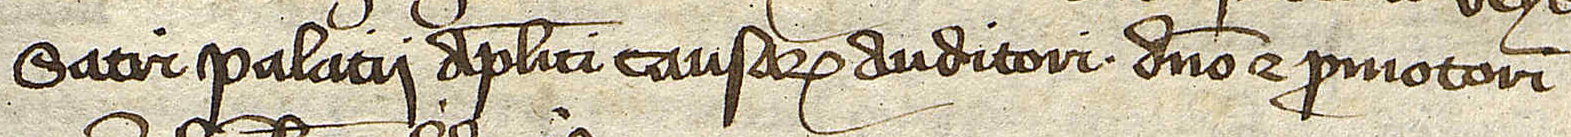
Sacri palacii Ap*lici cauſa* Auditori . d*no @ p*motori
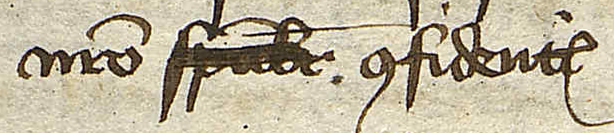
n*ro ſpabr* *fident*
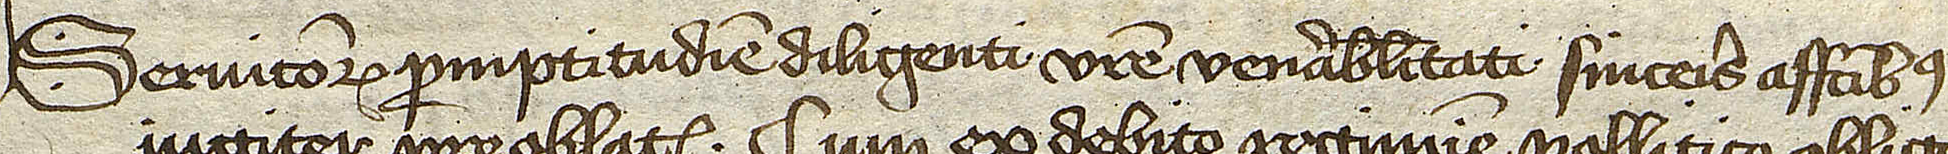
Seruito* p*mptitudi*e diligenti v*re ven*ab*litati ſince*is aff*c*ib*
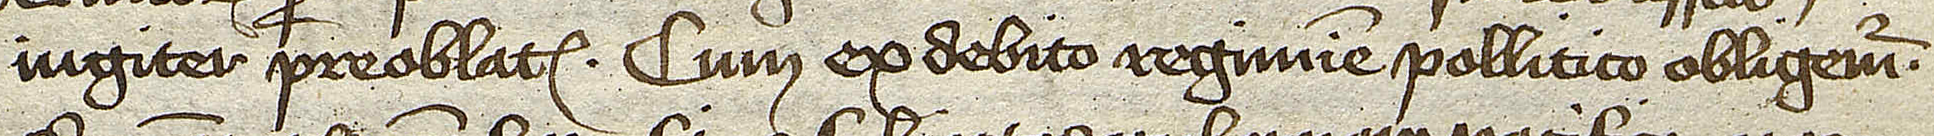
iugiter preoblat* . Cum ex debito regimi*e pollitico obligem*
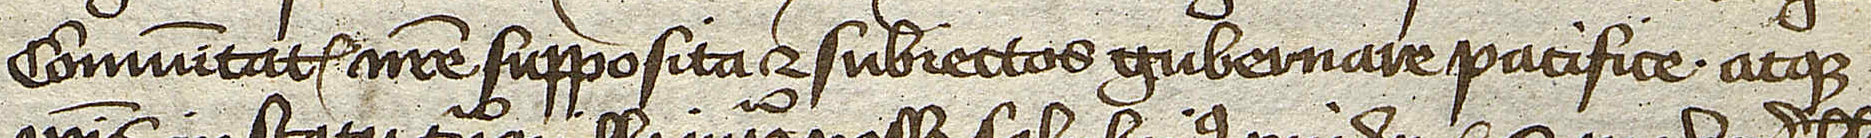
Co*mu*itat* n*re ſuppoſita @ ſubiectos gubernare pacifice . atq*
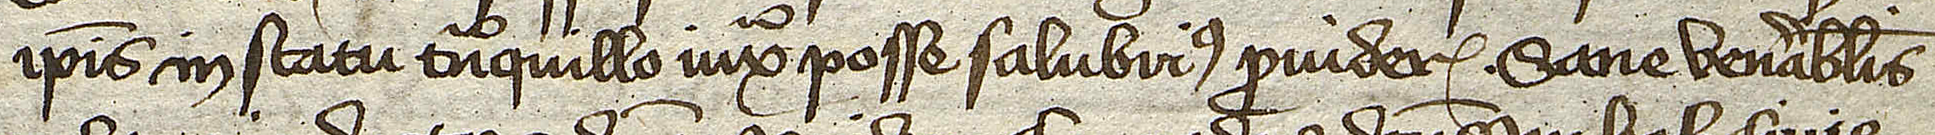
ip*is in ſtatu t*nquillo iux* poſſe ſalubri* p*uider* . Sane ven*ab*lis
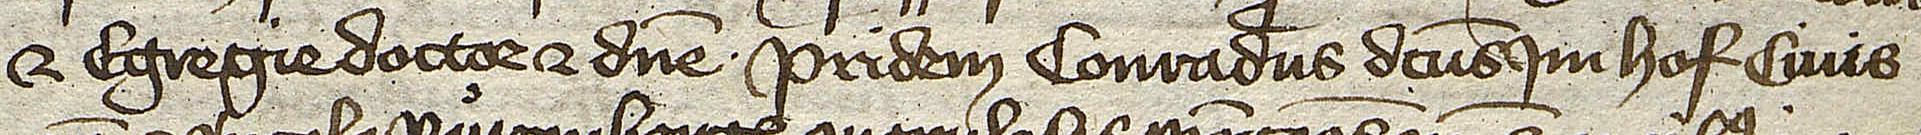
@ Egregie doctor @ d*ne Pridem Conradus d*c*us Im hof Ciuis
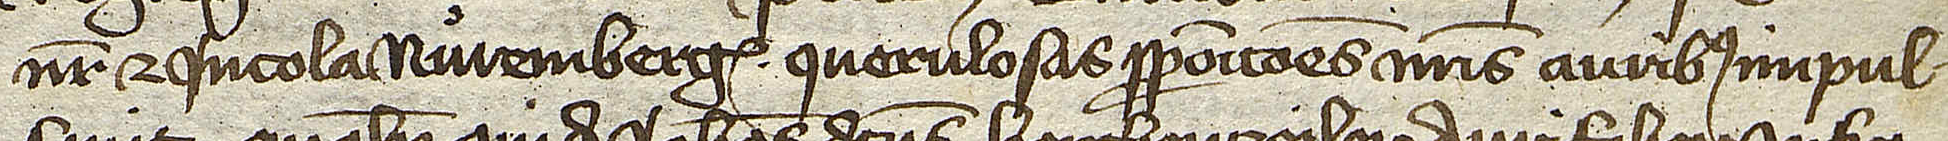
n*r et Incola Nüremberg* . queruloſa p*po*ic*o*es n*ris aurib* impul -
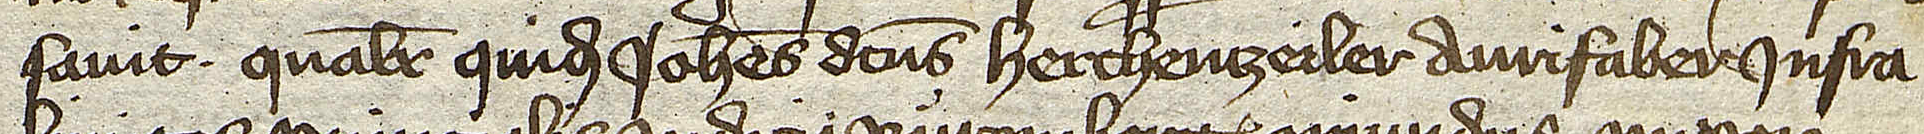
ſauit . qual*r quid* Ioh*es d*c*us Herchencʒeiler Aurifaber Infra
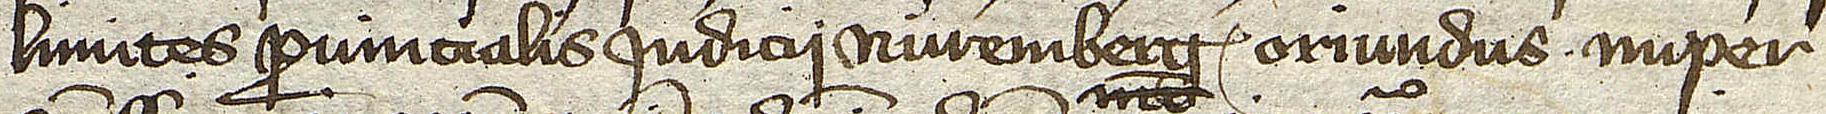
limites p*uincialis Iudicii Nüremberg* oriundus . nuper
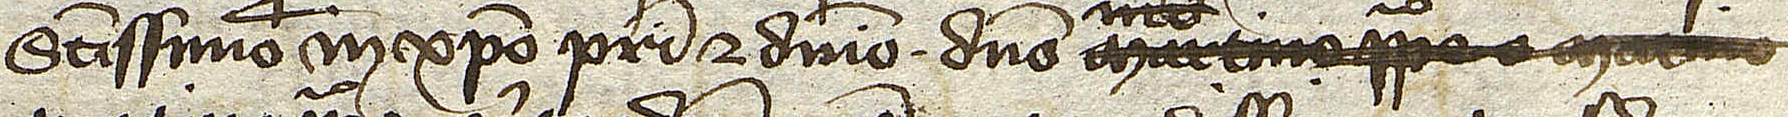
S*tissimo in xpo* p*ri @ d*no . d*no Martino ppe* % Matino
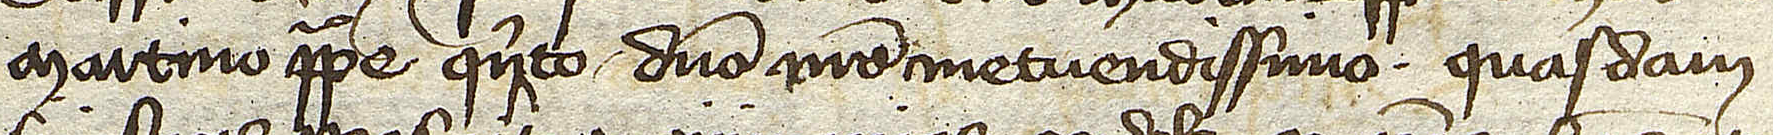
Martino p*pe q*nto / d*no n*ro metuendiſiſmo . quaſdam
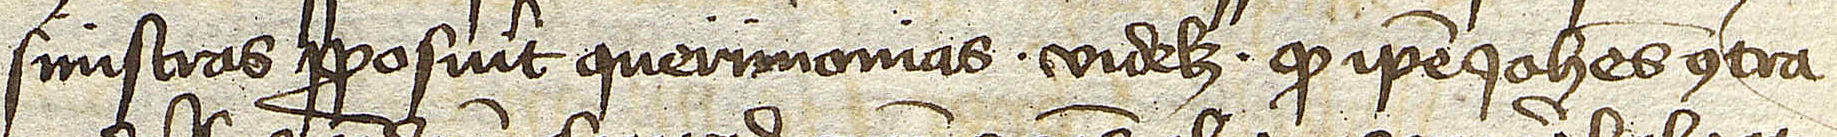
ſiniſtras p*poſu*it querimonias . videl* q* ip*e Ioh*es *tra
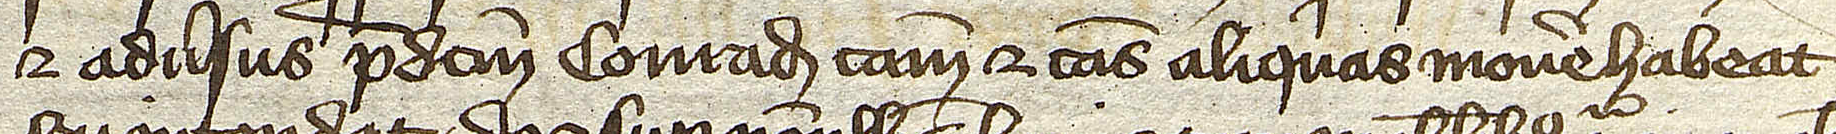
@ adu*ſus p*d*c*m Conrad* c*am @ c*as aliquas moue* habeat
